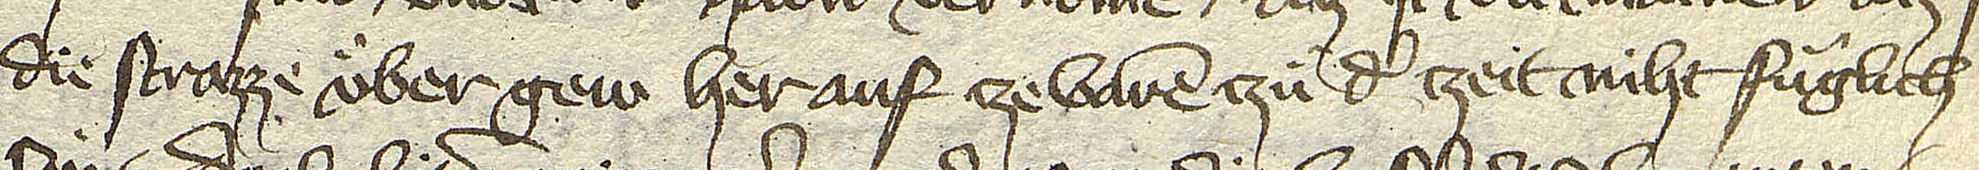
die ſtraʒʒe ber gew her auf cʒevare* cʒü d* cʒeit niht füglich
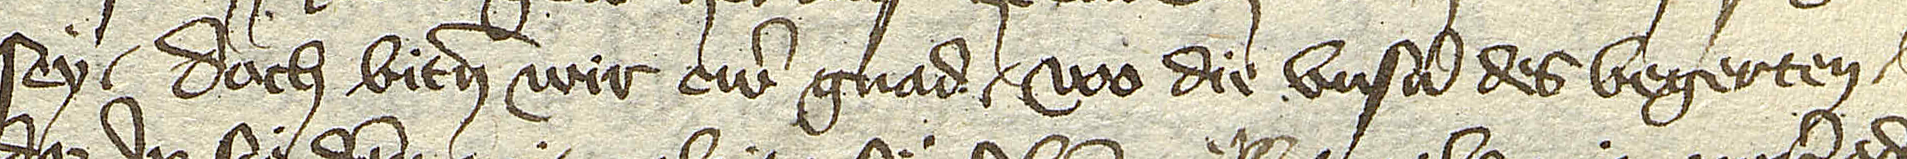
ſey / doch bitn* wir ew* gnad / wo die vnſn* des begerten /
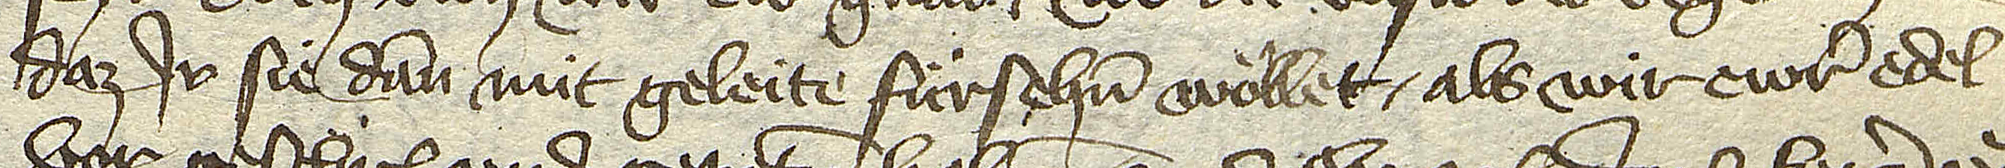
daʒ Ir ſie dan* mit geleite fürſehn* wöllet / als wir ewr* edel
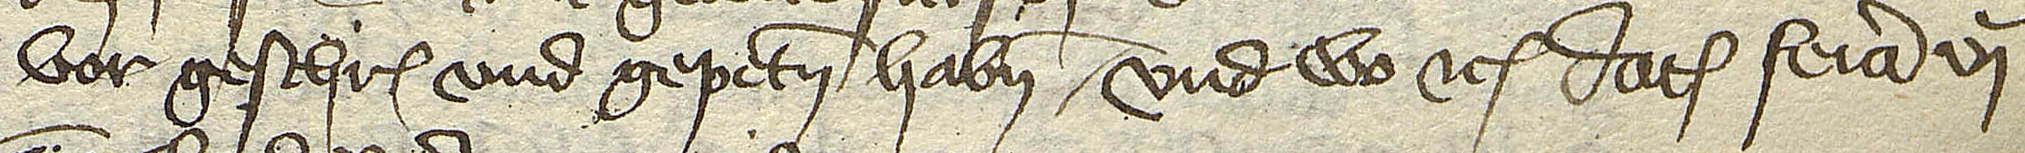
vor geſchr* vnd gepetn* habn* / vnd wo ec* dat* feia* vi*
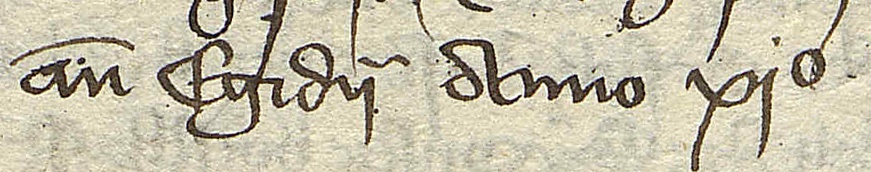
an* Egidii* Anno xi* .
